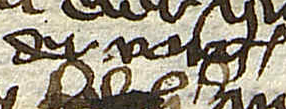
der vorg*
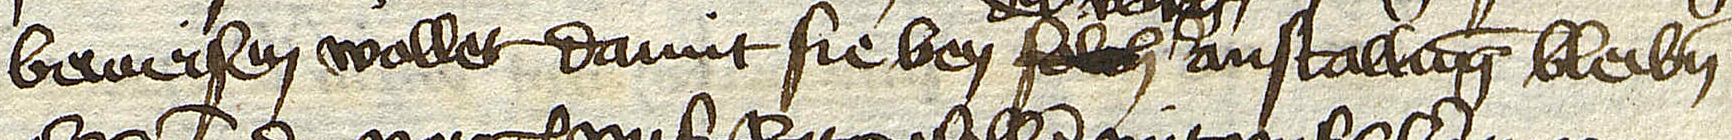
beweiſen wöllet damit ſie bey ſölch anſtallu*g bleib*n
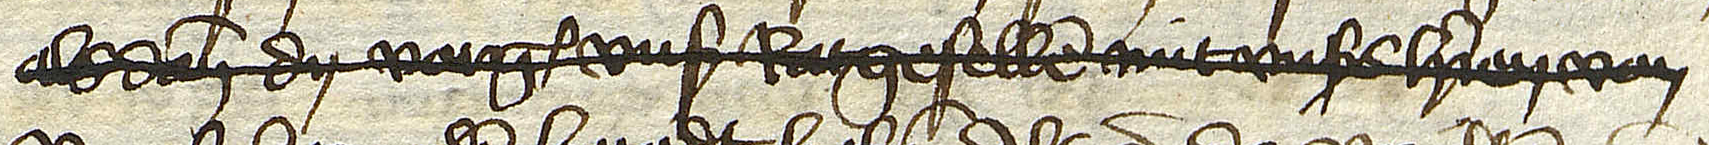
als dan* dy vorg* vnſ* Ratgeſelle* mit vnſ*s h*ren von
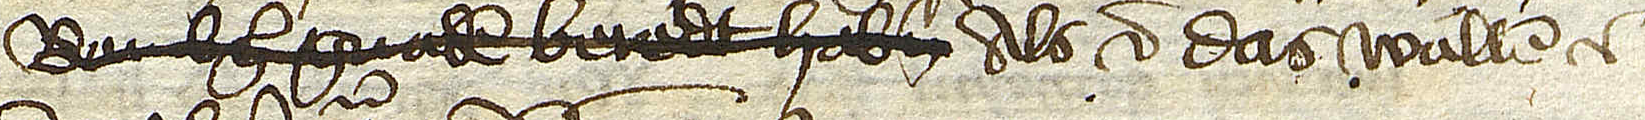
Bamb*g gnade* beredt hab*n Als ec* das wölle* ec*
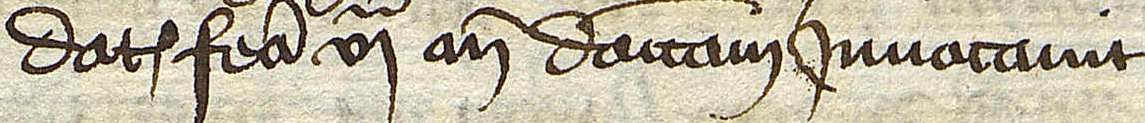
Dat* fea* vi* an* doicam* Inuocauit
